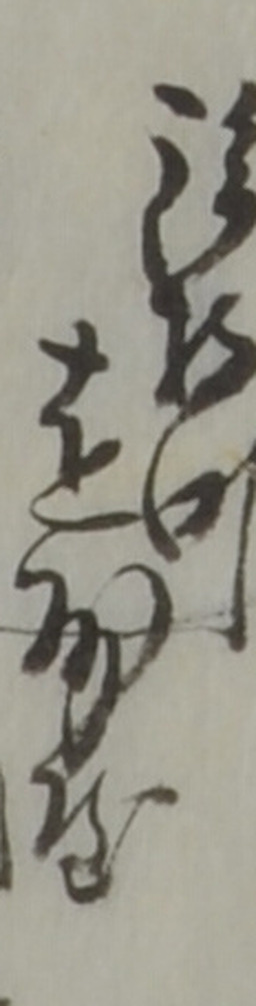遠州屋
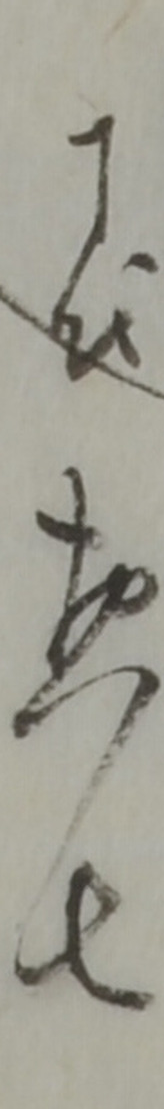丁代惣七
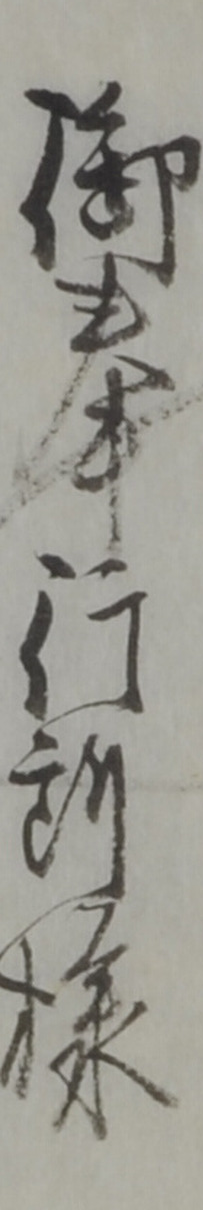御奉行所様
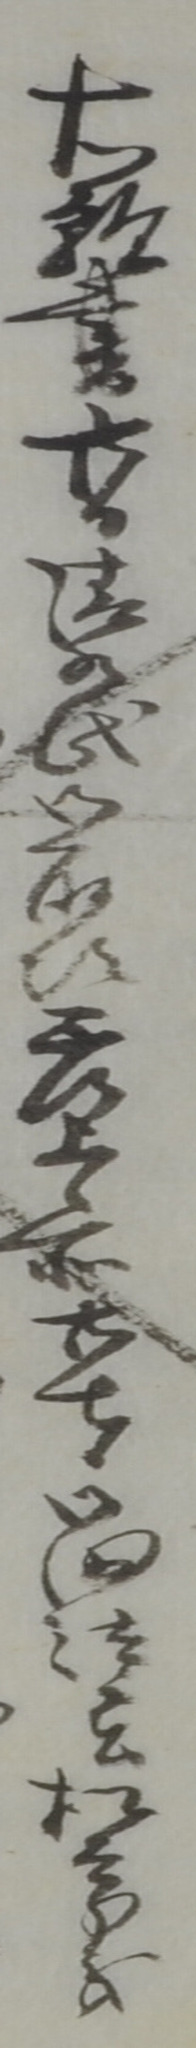右願書廿日清水氏御取次差上候所廿七日御沙汰ニ者松太郎義

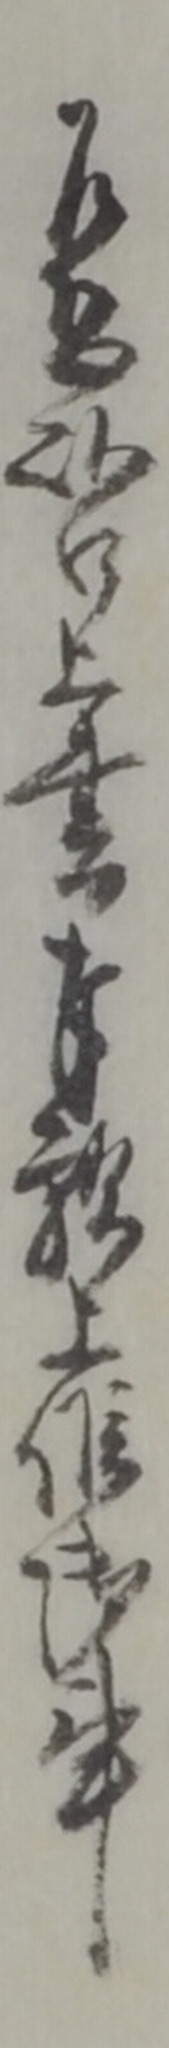乍恐以口上書奉願上候御事
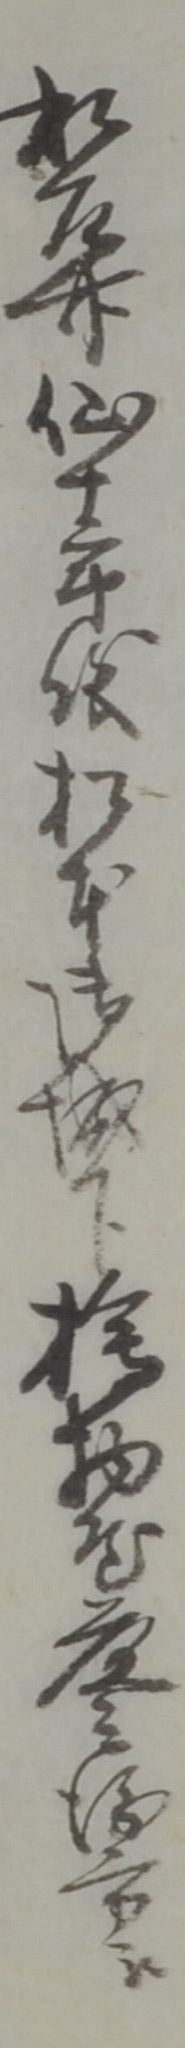私厄介仙十郎儀松本御城下桧物屋藤兵衛方江
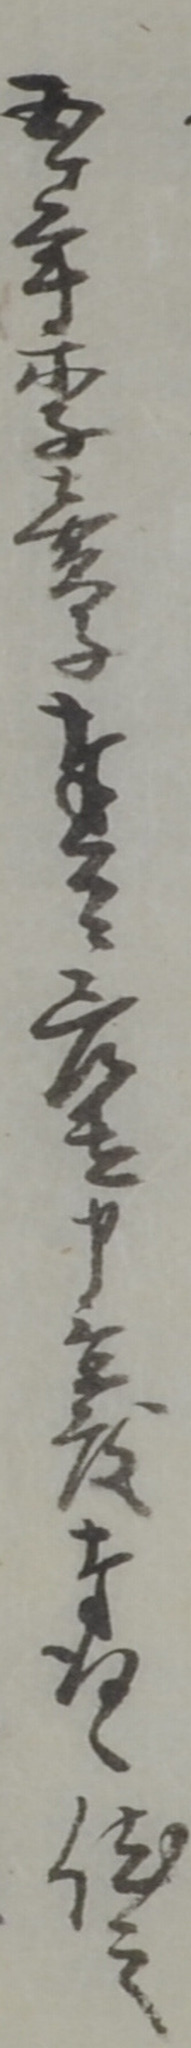五ヵ年季売子奉公ニ差遣申置度奉存候依之
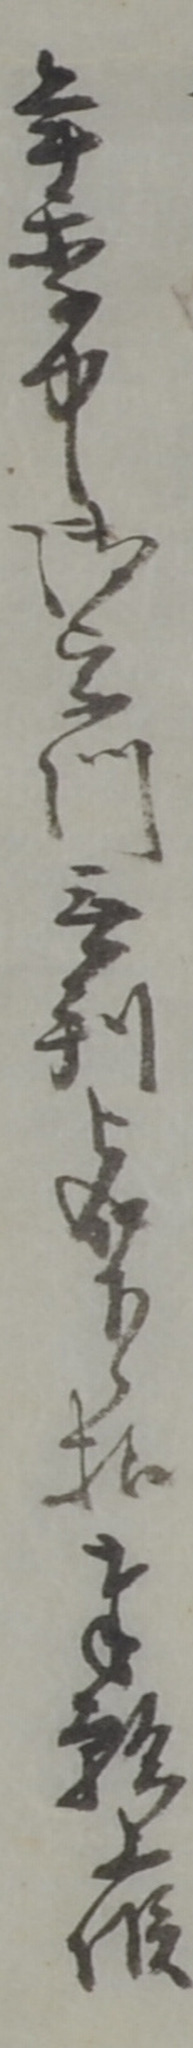年季中御宗門無判被成下候様奉願上候
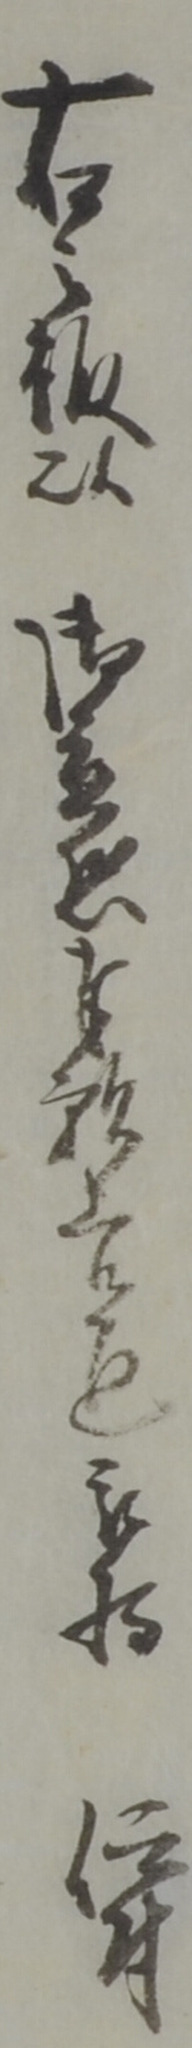右之趣以御慈悲奉願上候通被為仰付
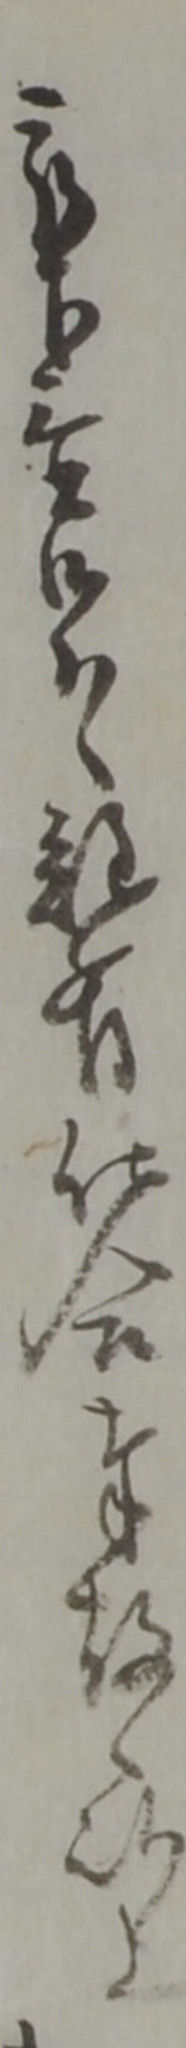被下置候ハヽ難有仕合奉存候以上
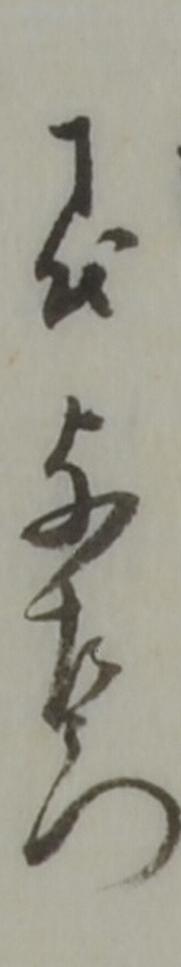丁代与左衛門
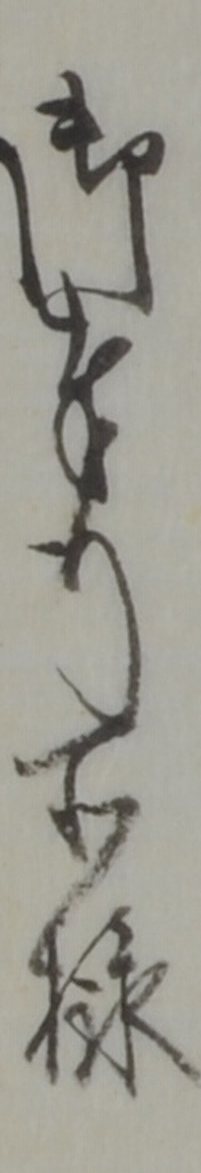御奉行所様
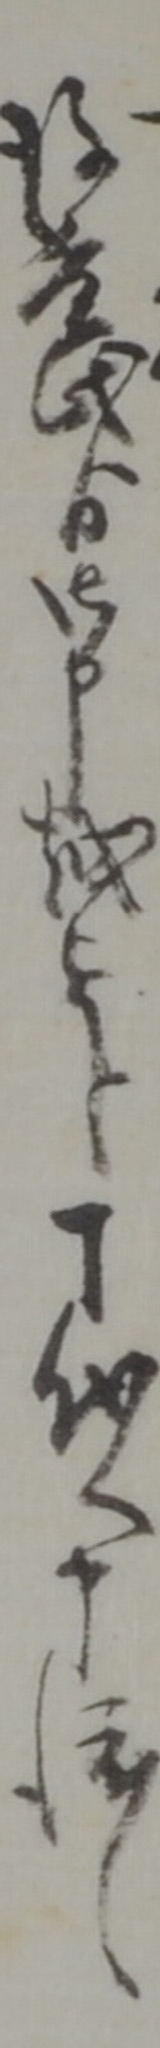後藤氏ゟ御申越被下丁代へ申渡候
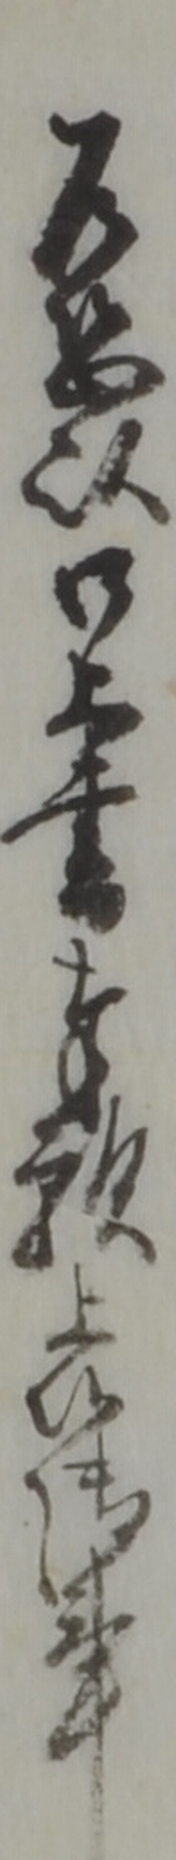乍恐以口上書奉願上候御事
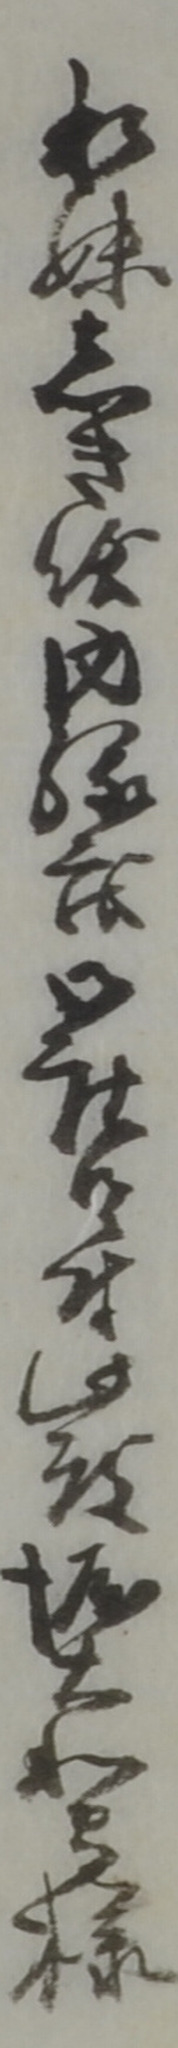私妹志き儀内縁も御座候ニ付此度堀大和守様
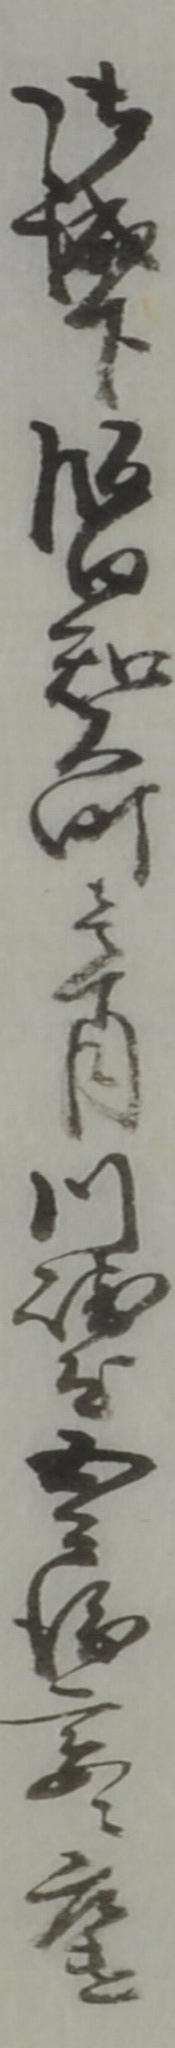御城下飯田知久町壱丁目川崎屋五兵衛妾ニ差遣
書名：諸願書控簿
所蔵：伊那市立高遠町図書館・合同会社AMANE
